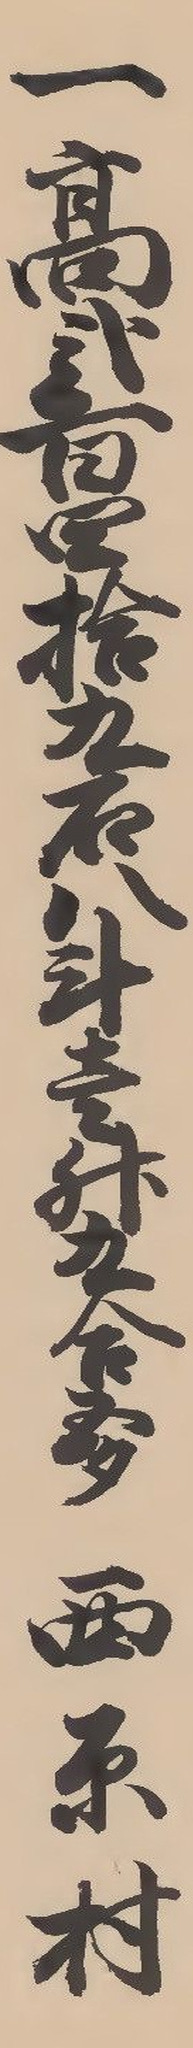一高弐百四拾九石八斗壱升九合五勺西原村
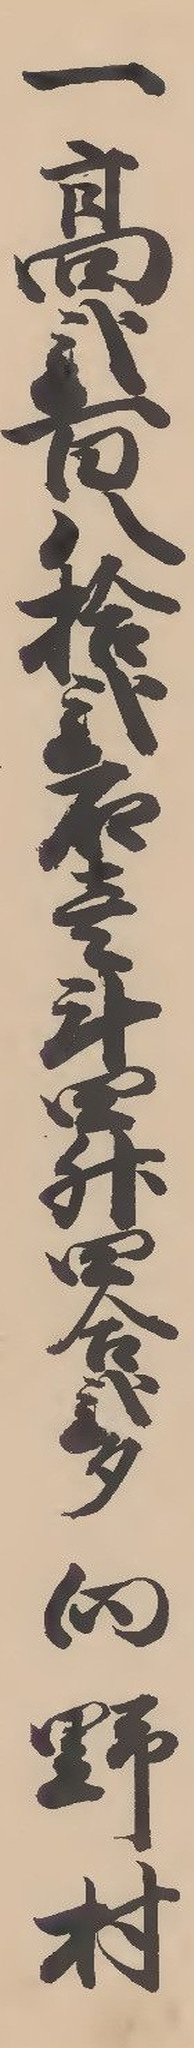一高弐百八拾弐石壱斗四升四合弐勺向野村

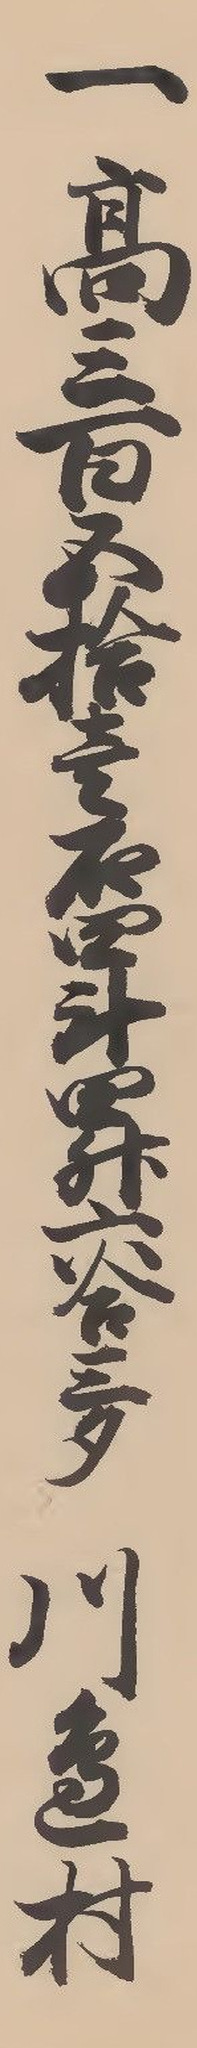一高三百五拾壱石四斗四升六合三勺川辺村
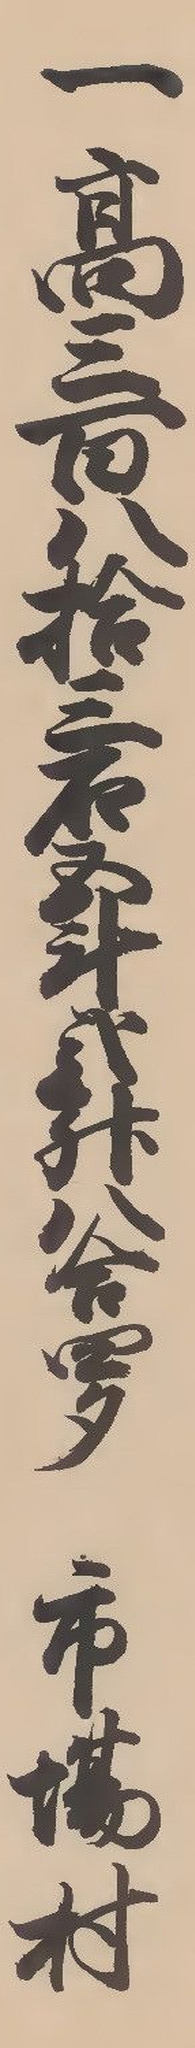一高三百八拾三石五斗弐升八合四勺市場村
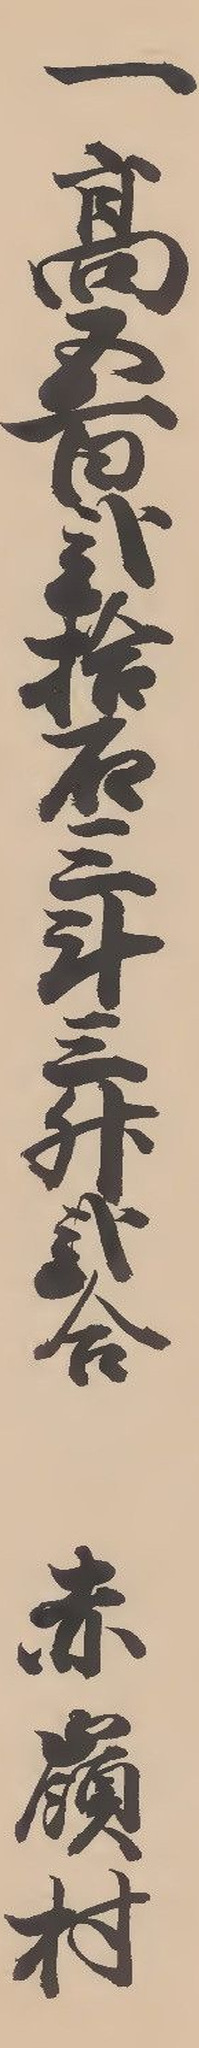一高五百弐拾石三斗三升弐合赤嶺村
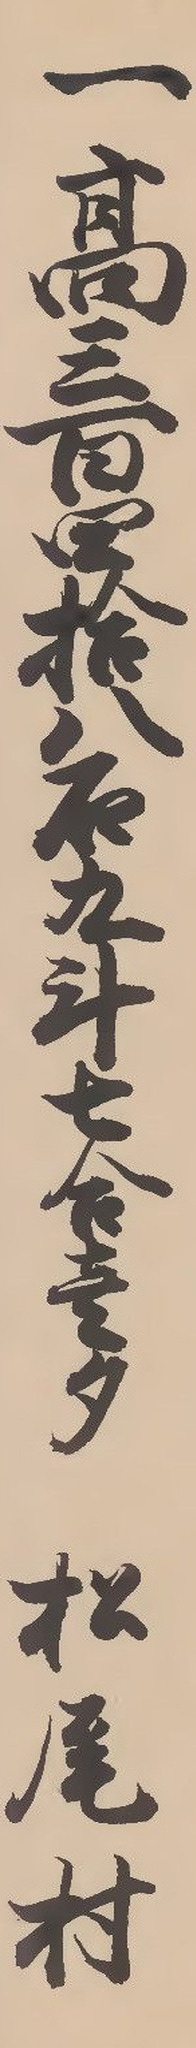一高三百四拾八石九斗七合壱勺松尾村
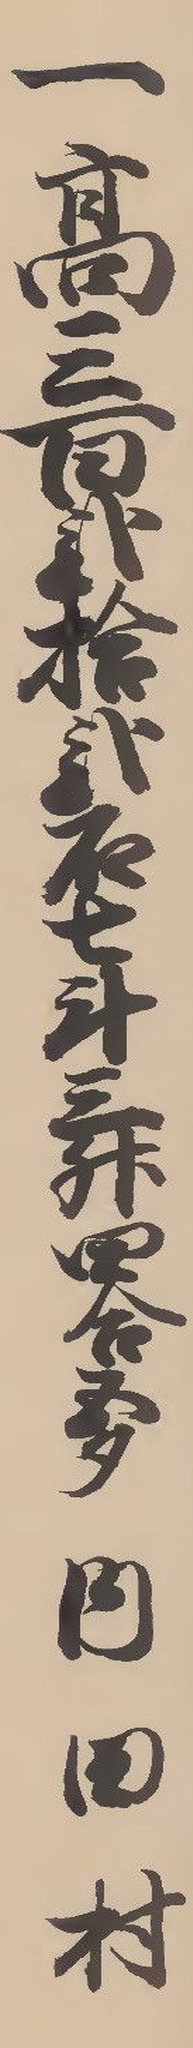一高三百弐拾弐石七斗三升四合五勺内田村
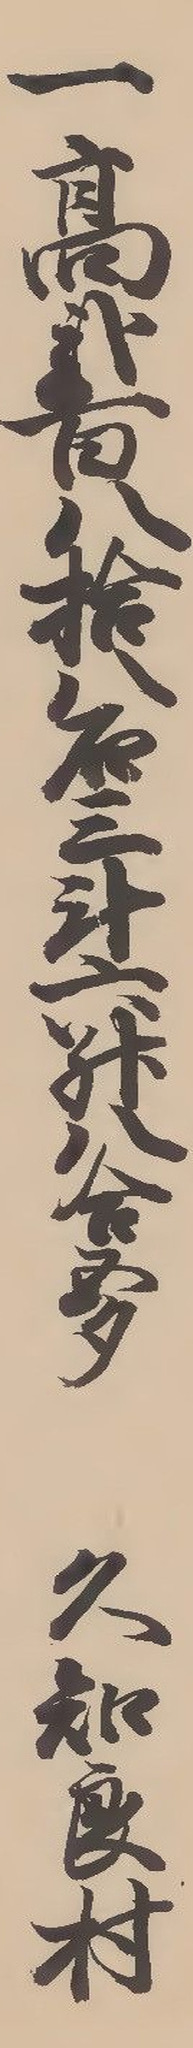一高弐百八拾八石三斗六升八合五勺久知良村
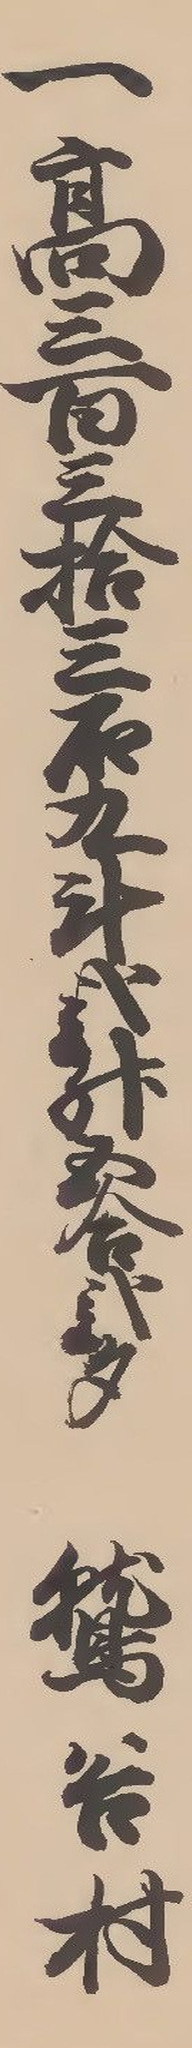一高三百三拾三石九斗弐升五合弐勺鷲谷村
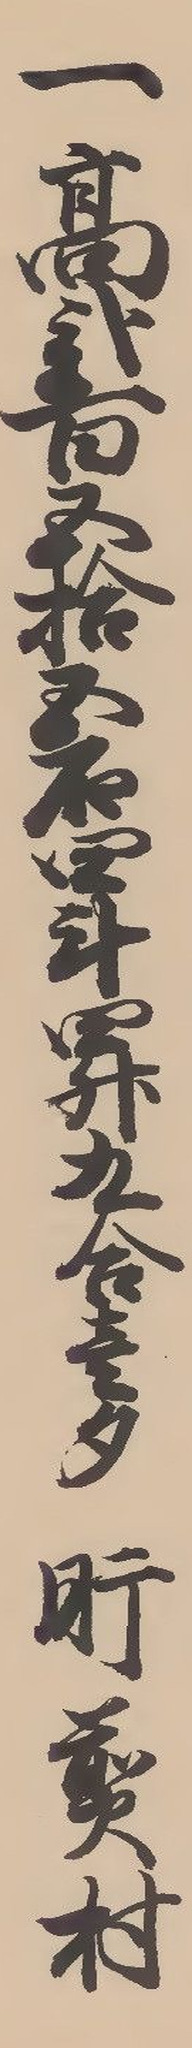一高弐百五拾五石四斗四升九合壱勺肝煎村

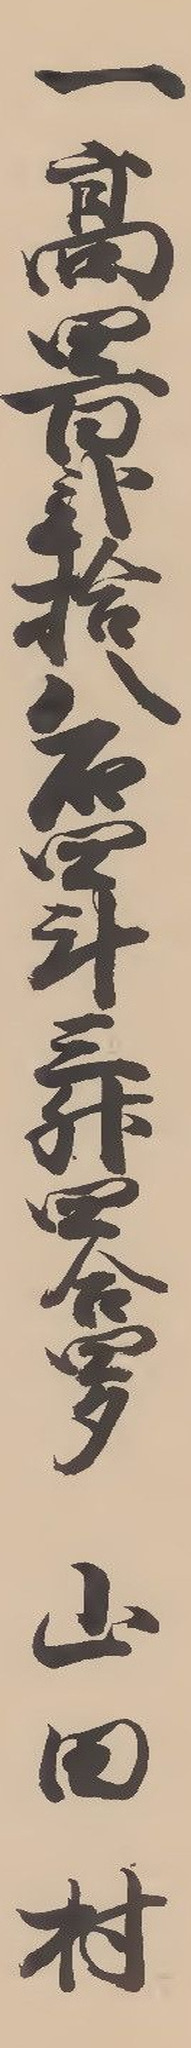一高四百弐拾八石四斗三升四合四勺山田村
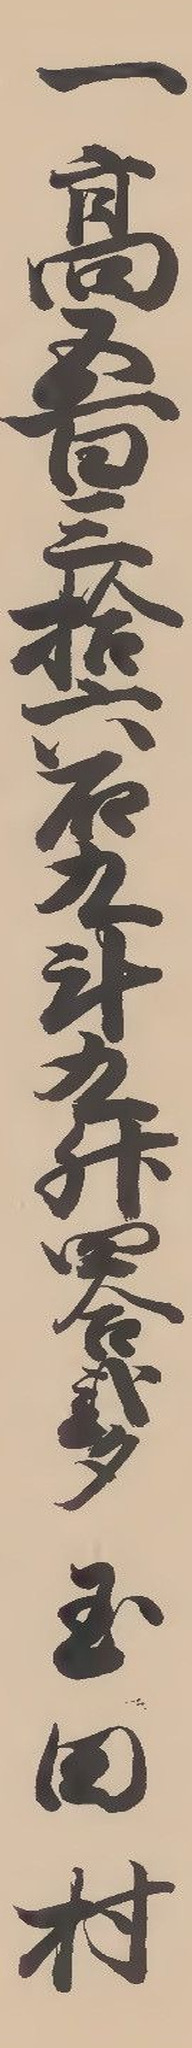一高五百三拾六石九斗九升四合弐勺玉田村
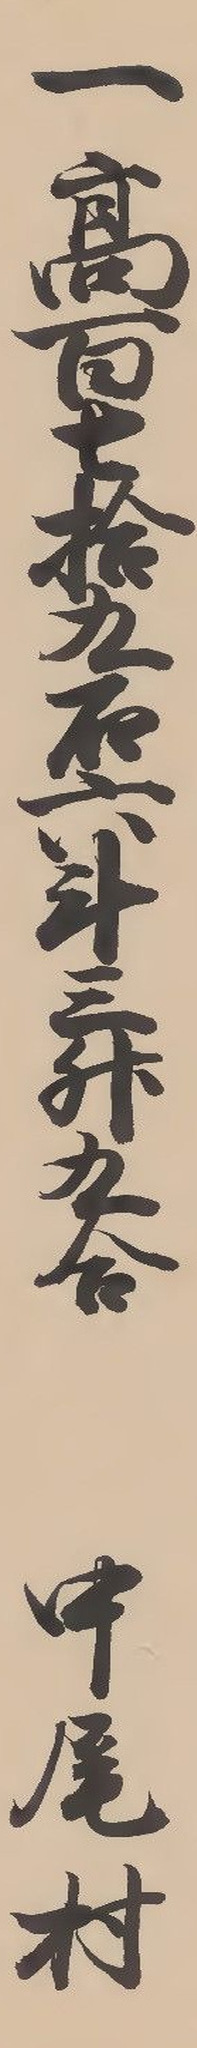一高百七拾九石六斗三升九合中尾村
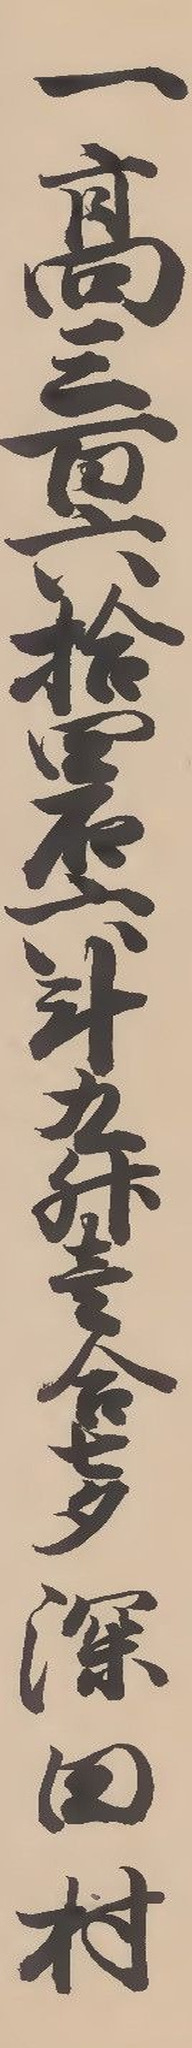一高三百六拾四石六斗九升壱合七勺深田村
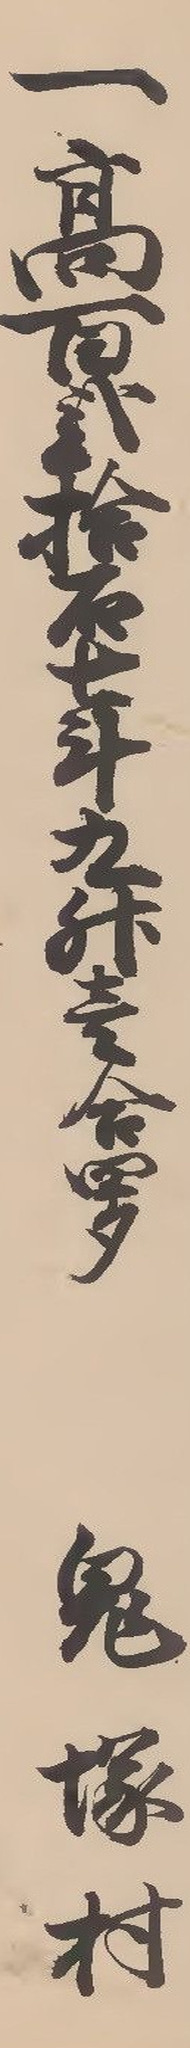一高百弐拾石七斗九升壱合四勺鬼塚村
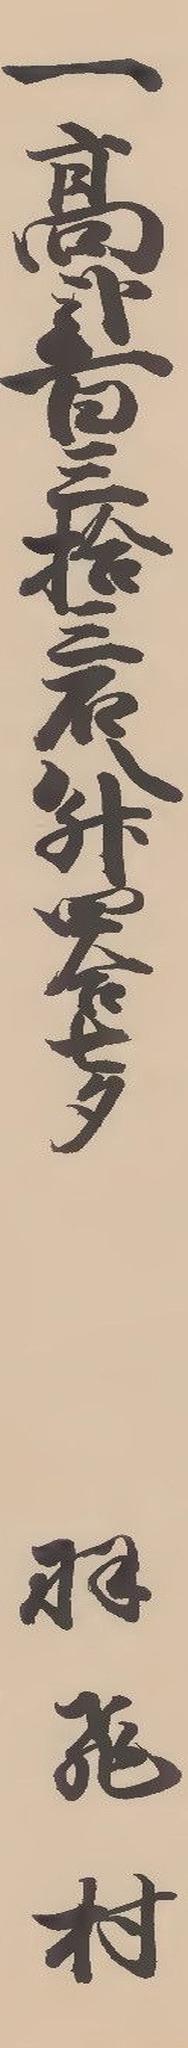一高弐百三拾三石八升四合七勺羽飛村
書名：豊後国郷帳
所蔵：国立公文書館 National Archives of Japan
